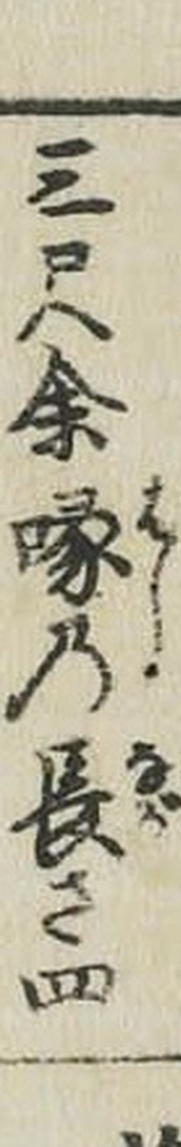三尺余喙の長さ四
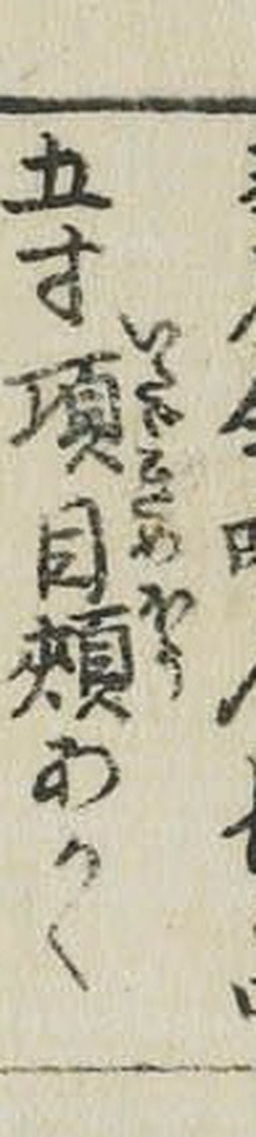五寸項目頬あかく
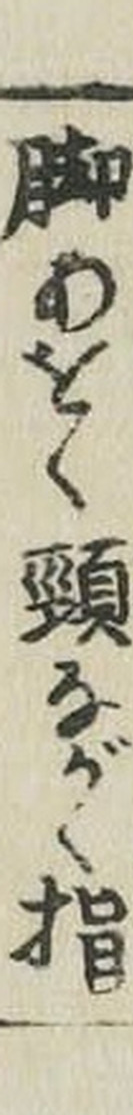脚あをく頸ながく指
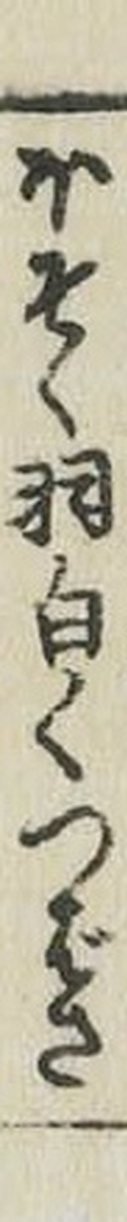ほそく羽白くつばさ
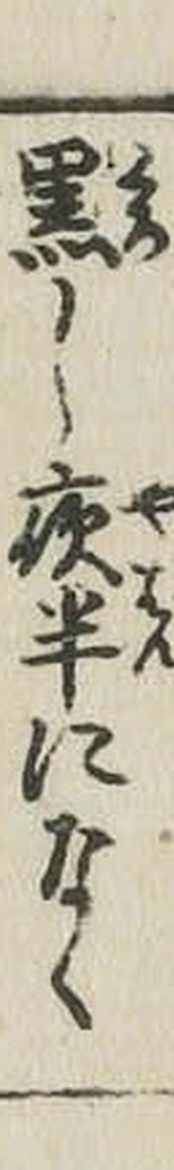黒し夜半になく
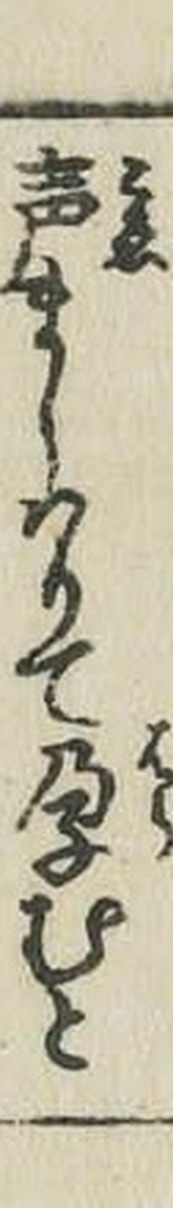声ましはりて孕むと
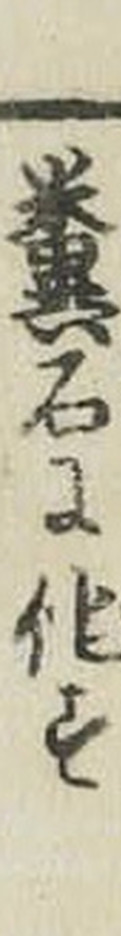糞石に化す
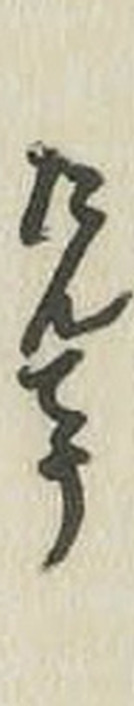たんてう
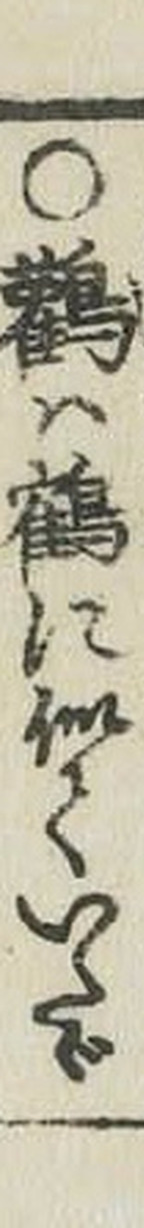○鸛は鶴に似ていたゞ
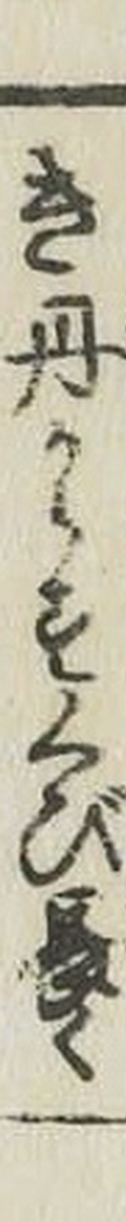き丹からすくび長く
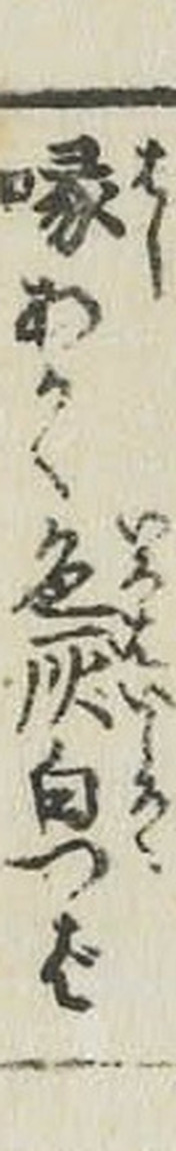喙あかく色灰白つば
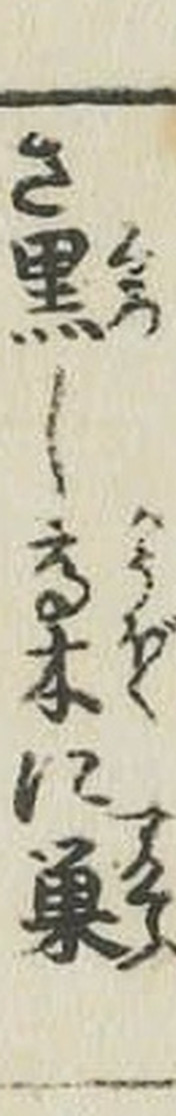さ黒し高木に巣
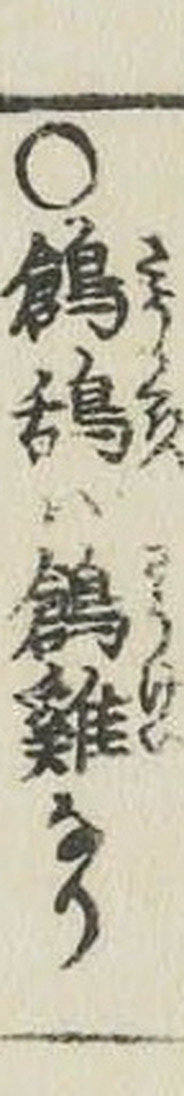○鶬鴰は鶬鶏なり
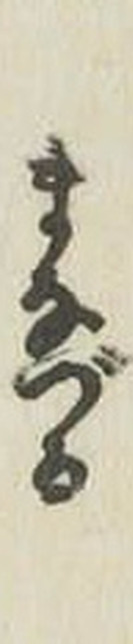まなづる
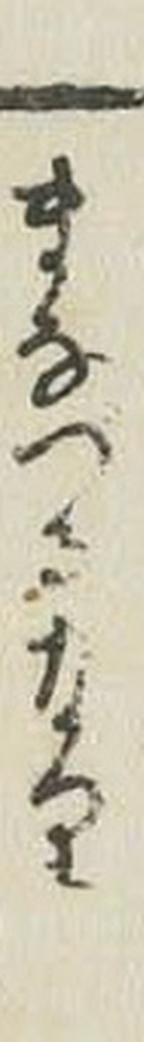まなづるなり
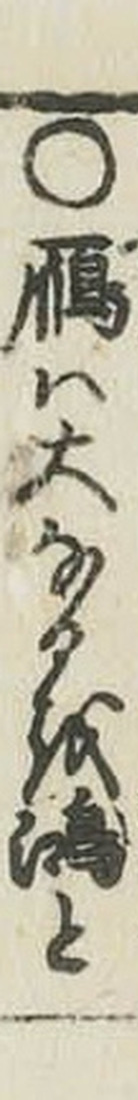○鴈は大なるを鴻と
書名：増補頭書訓蒙図彙大成 10巻 6:巻之12-13
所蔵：東京学芸大学教育コンテンツアーカイブ
